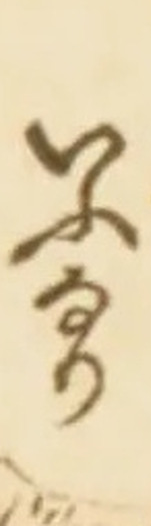いふなり
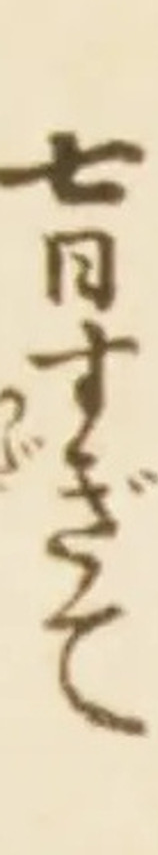七日すぎて
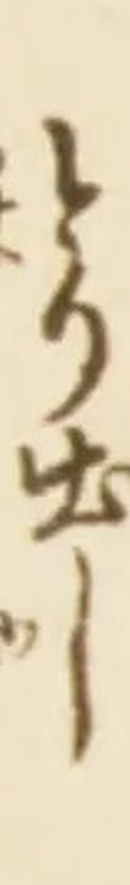とり出し
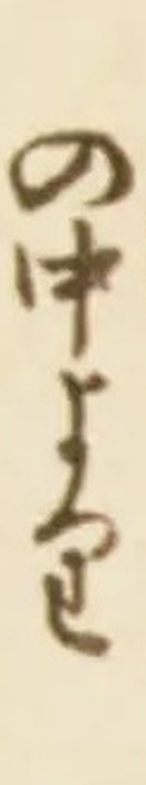の中より
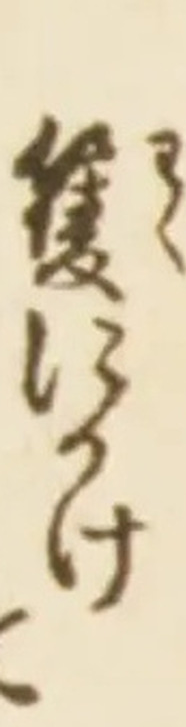篗にかけて
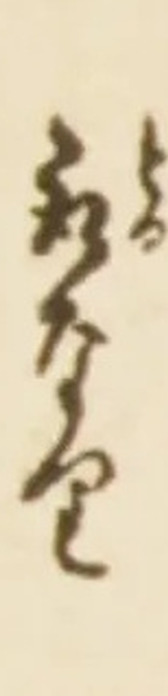取なり

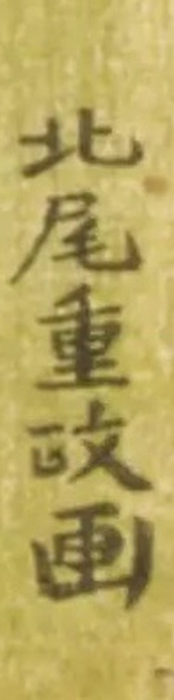北尾重政画
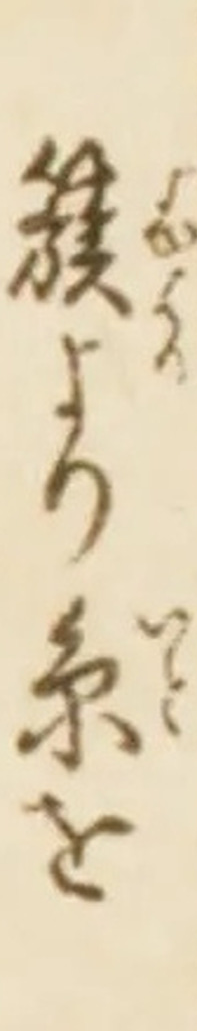蔟より糸を
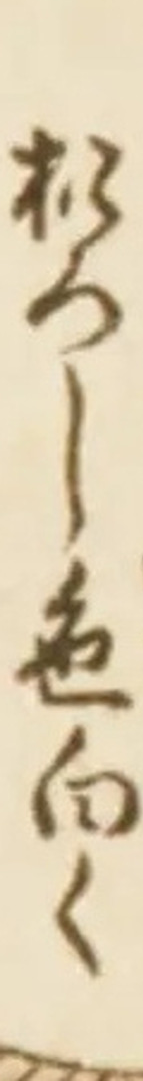おろし色白く
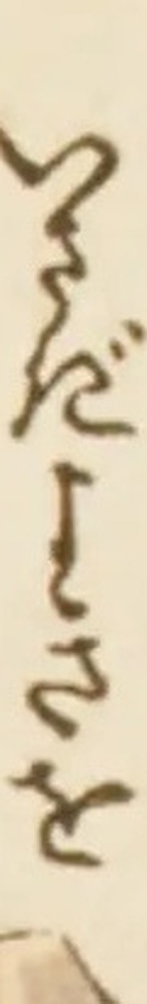いさぎよきを
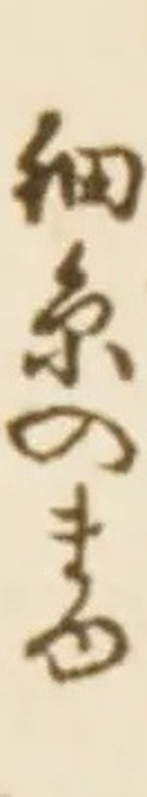細糸のまゆ
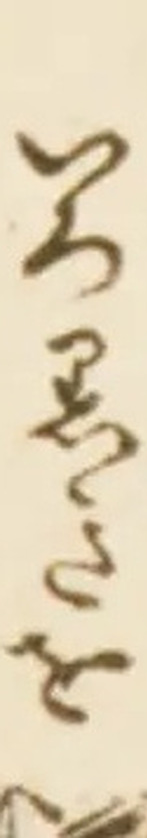いろ黒きを
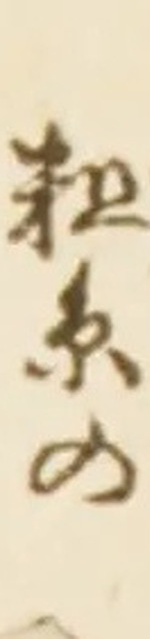粗糸の
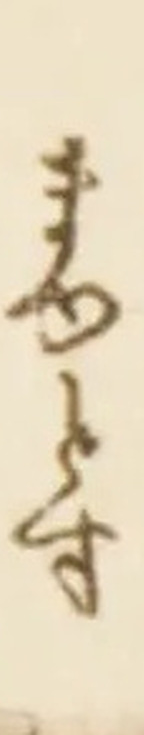まゆとす
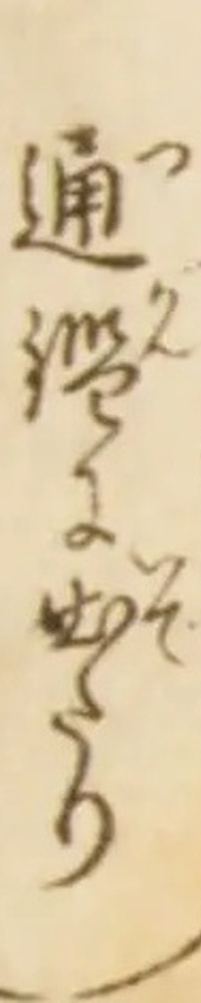通鑑に出たり
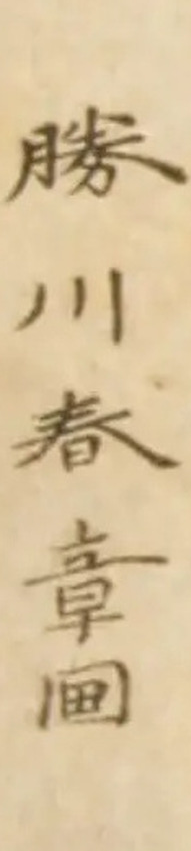勝川春章画
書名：画本宝能縷
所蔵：国立国会図書館 National Diet Library, JAPAN
